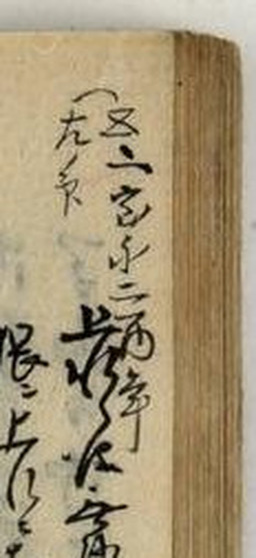一宝永二酉年
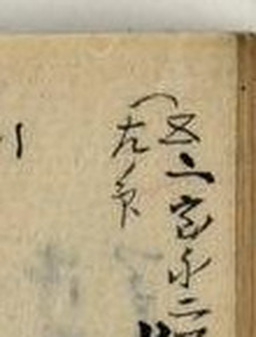左ノ印
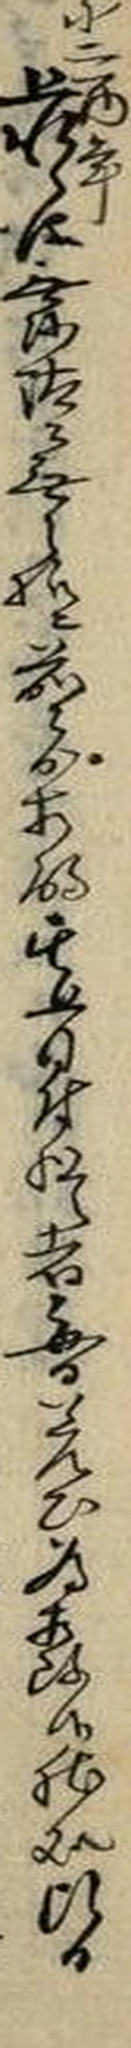上水之儀無沙汰に無之様に前々ゟ相触其上目付組之者毎日差出為相改候然処頃日
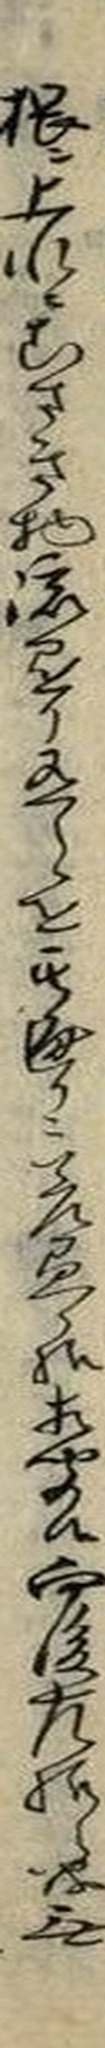猥に上水にむさき物流懸り有之候を其通りに差置候様相聞候向後左様之儀無
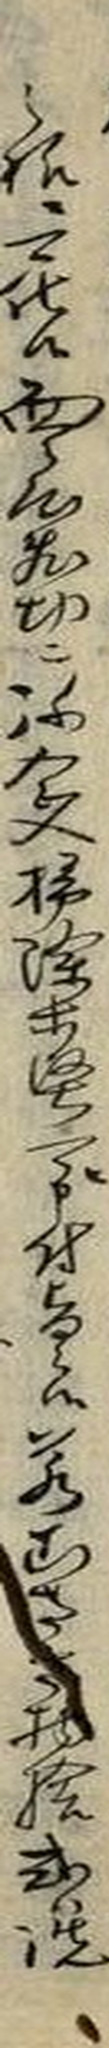之様に可仕候面々屋敷切に弥念入掃除等堅可被申付旨に候若むさき物捨或は洗
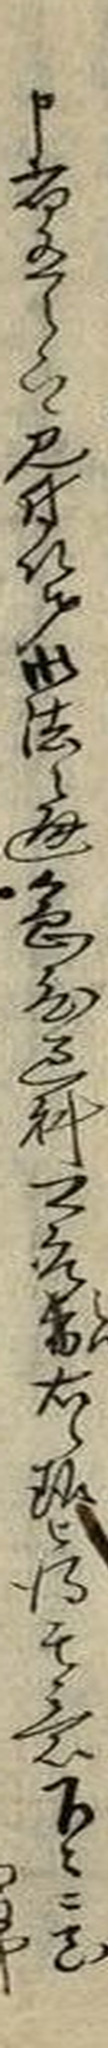申者有之候はゝ見付次第御法之通急度過料可取之候右之趣被得其意下々に至
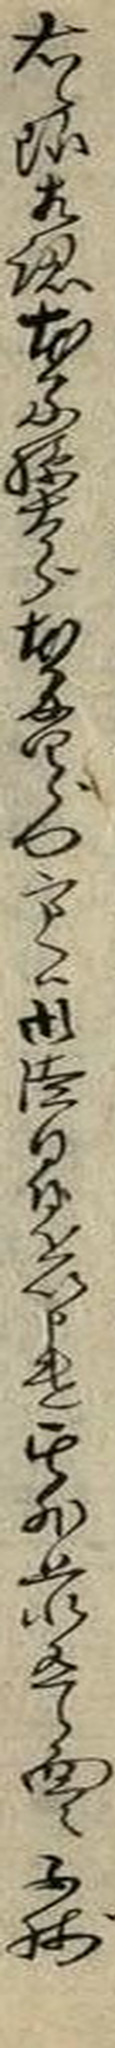右之趣相認本多孫太郎本多四郎右衛門方へは御徒目付を以申遣其外上水有之面々不残
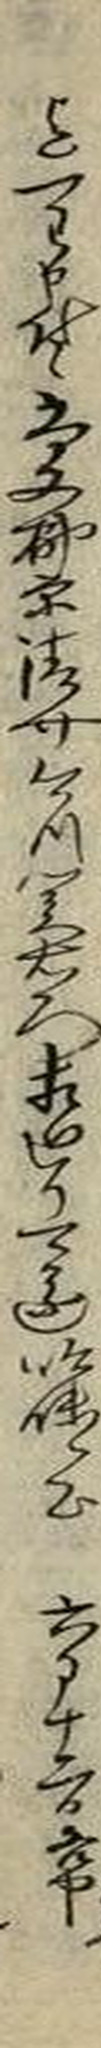迄可被申付候尚又榊原清介今川関右衛門相廻り可遂吟味候以上六月十二日各中目付中
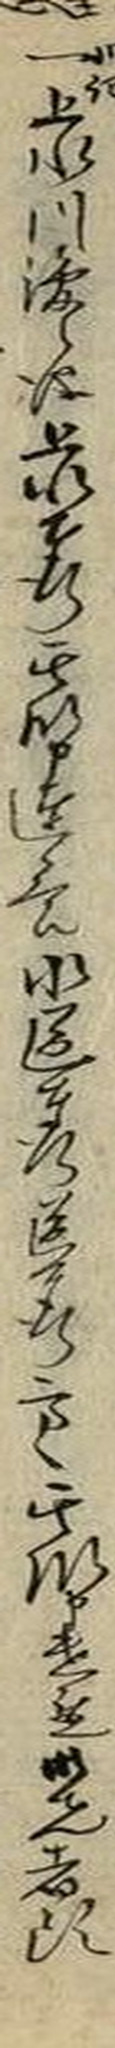一上水川浚之儀上水奉行其段申達候節水道奉行道奉行方へ其段申遣置御先者頭
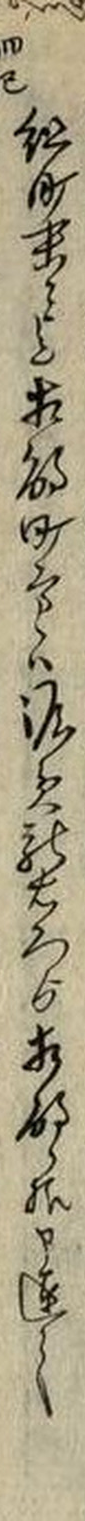組町末々迄相触町方へは渥美新右衛門ゟ相触候様申達之
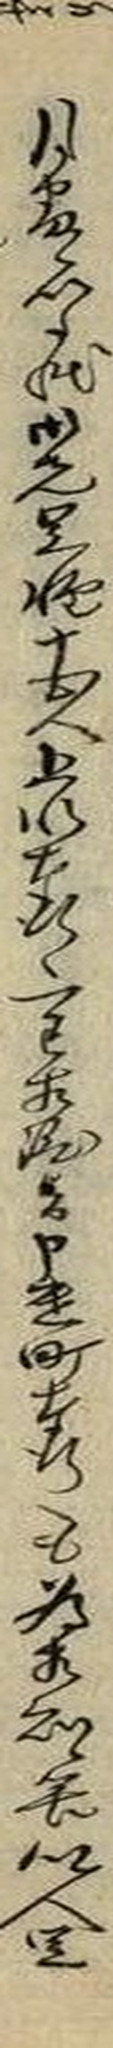月番へ以手紙御先足軽十五人上水奉行へ可被相渡旨申遣町奉行へも為相知候筈郷人足
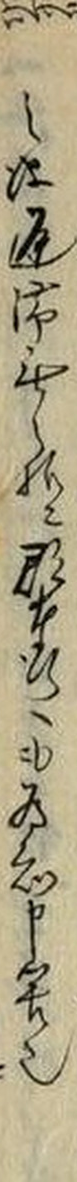之儀遅滞無之様に郡奉行へも為知申筈也
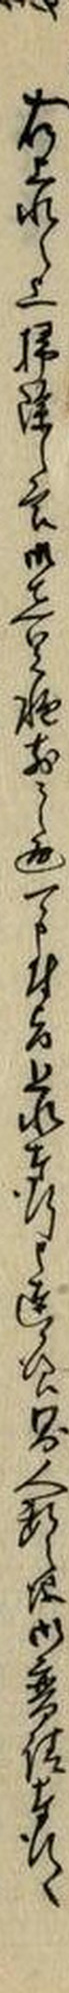右上水之止掃除之節御先足軽前々之通可申付旨上水奉行申達候得は則人数之儀御普請奉行へ
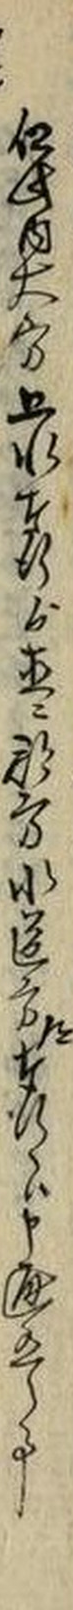但此内大方上水奉行ゟ直に郡方水道方道奉行へは申通有之事
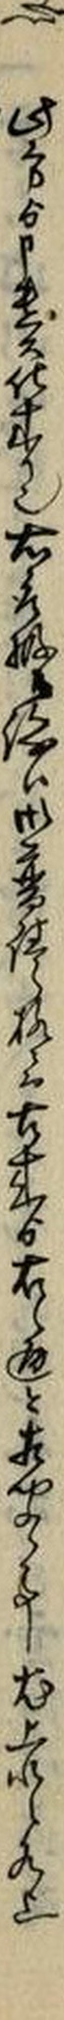此方ゟ申遣ス仕来り也右取扱候儀は御普請之様にて古来ゟ右之通と相聞候事尤上水之水止
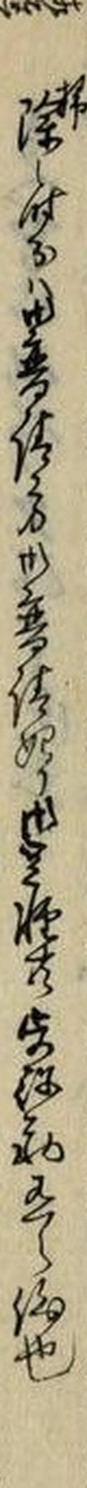掃除之時分は御普請方御普請始り御足軽共歩役勤有之儀也
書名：御城下諸事之部
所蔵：福井県文書館 Fukui Prefectural Archives
